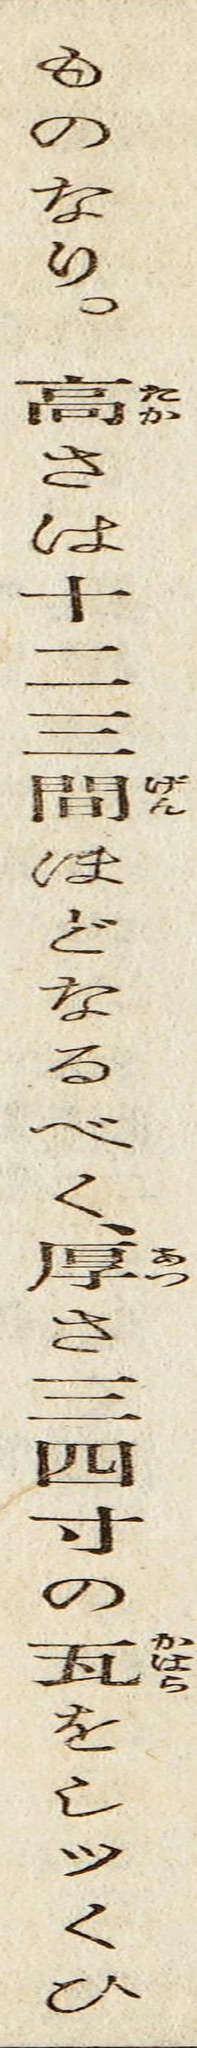ものなり。高さは十二三間ほどなるべく、厚さ三四寸の瓦をしツくひ
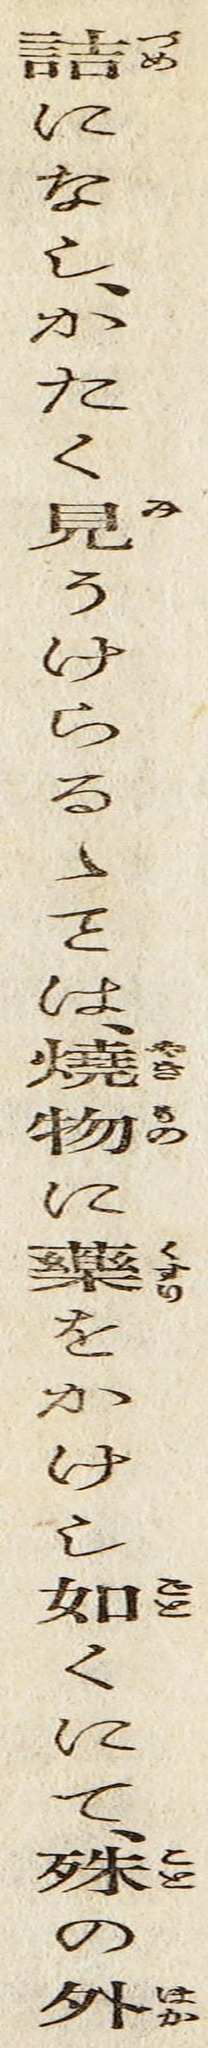詰になし、かたく見うけらるゝことは、焼物に薬をかけし如くにて、殊の外
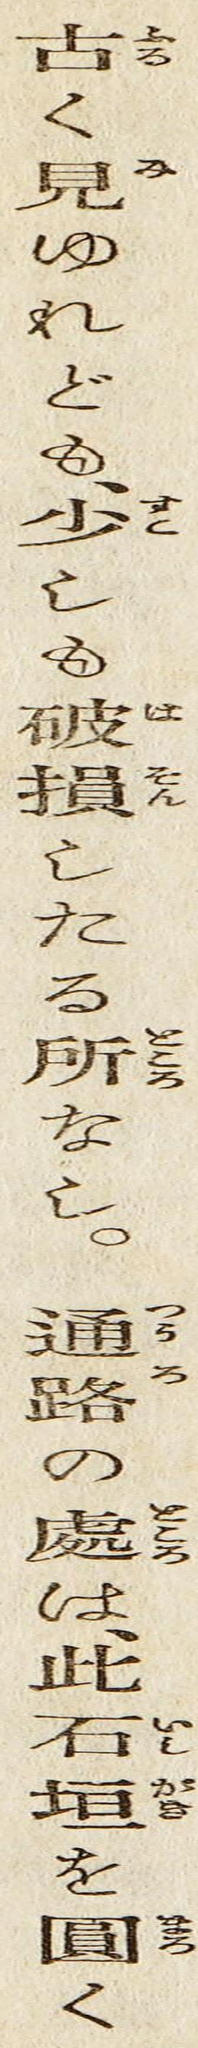古く見ゆれども、少しも破損したる所なし。通路の処は、此石垣を円く
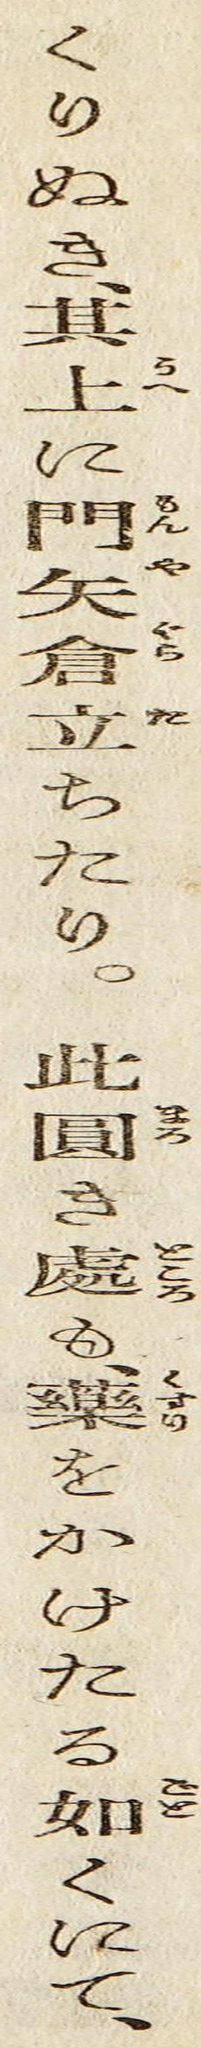くりぬき、其上に門矢倉立ちたり。此円き処も、薬をかけたる如くにて、
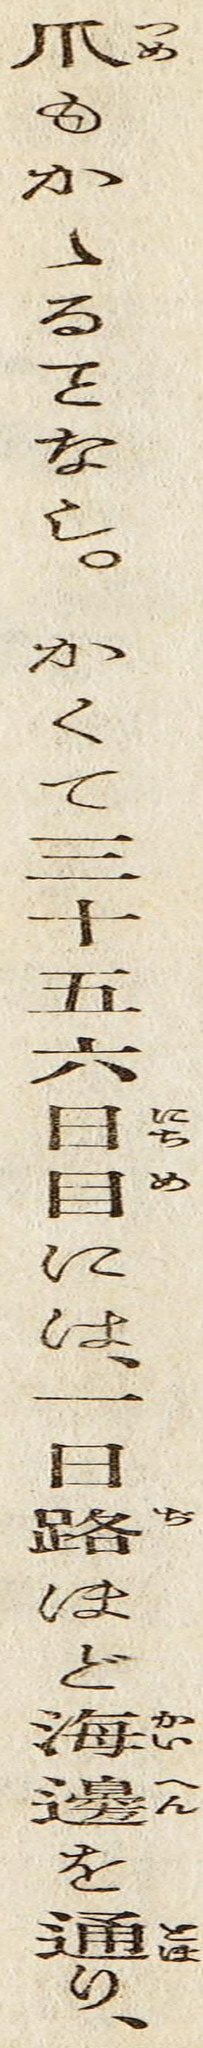爪もかゝることなし。かくて三十五六日目には、一日路ほど海辺を通り、
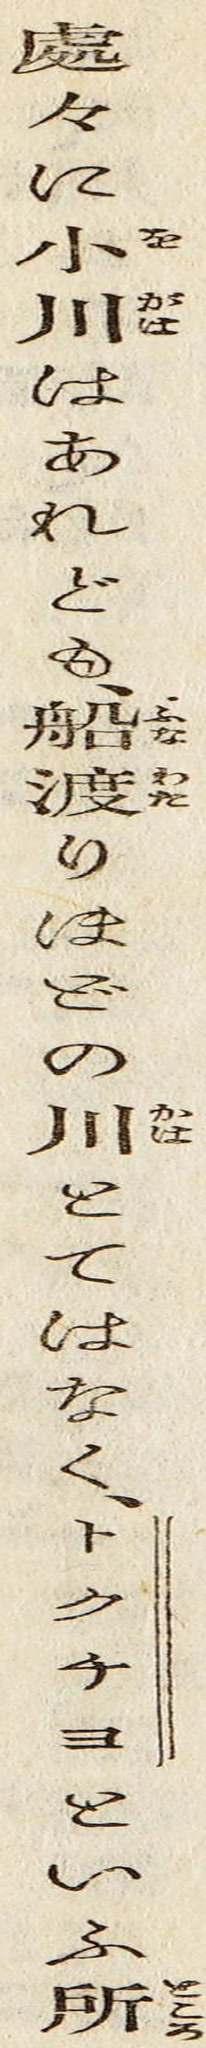処々に小川はあれども、船渡りほどの川とてはなく、トクチヨといふ所
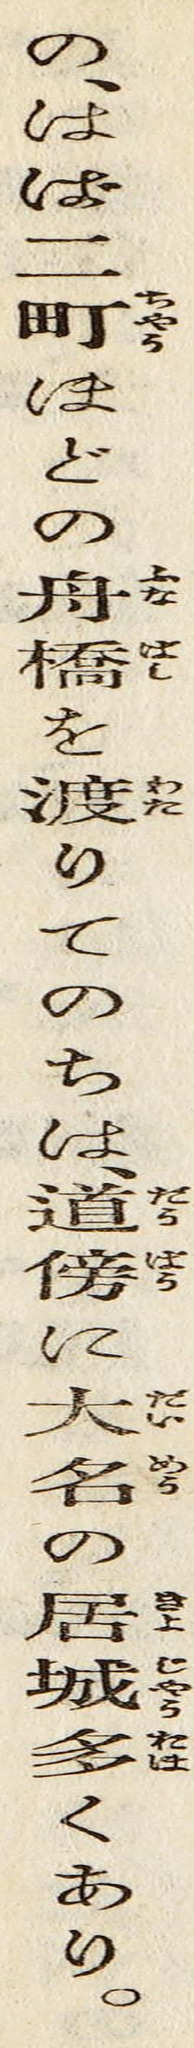の、はば二町ほどの舟橋を渡りてのちは、道傍に大名の居城多くあり。
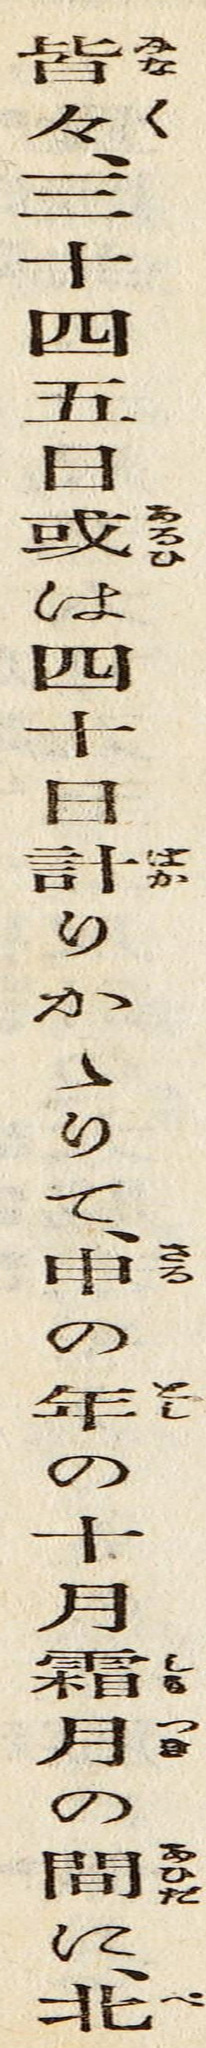皆々、三十四五日或は四十日計りかゝて、申の年の十月霜月の間に、北
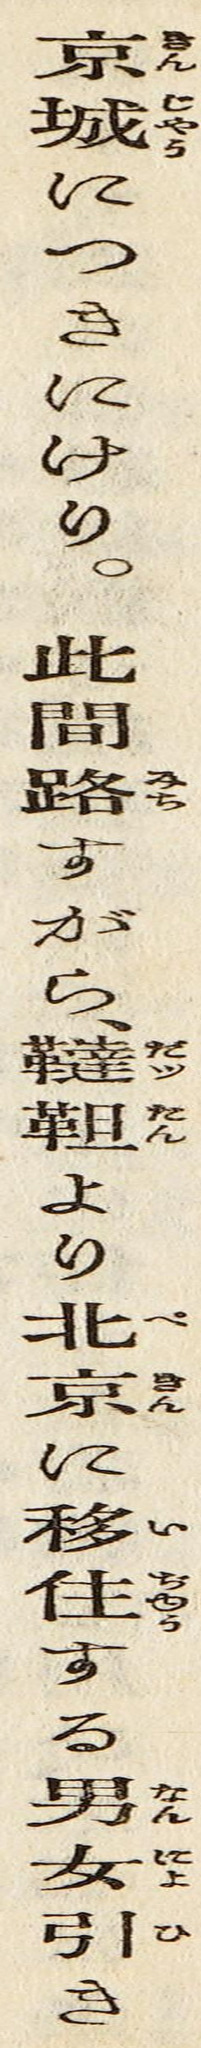京城につきにけり。此間路すがら、韃靼より北京に移住する男女引き
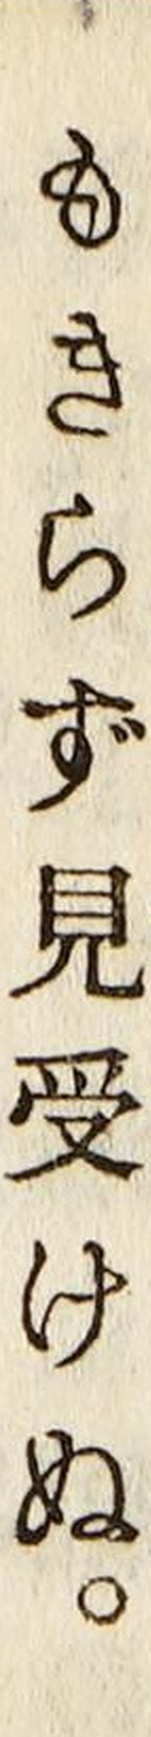もきらず見受けぬ。
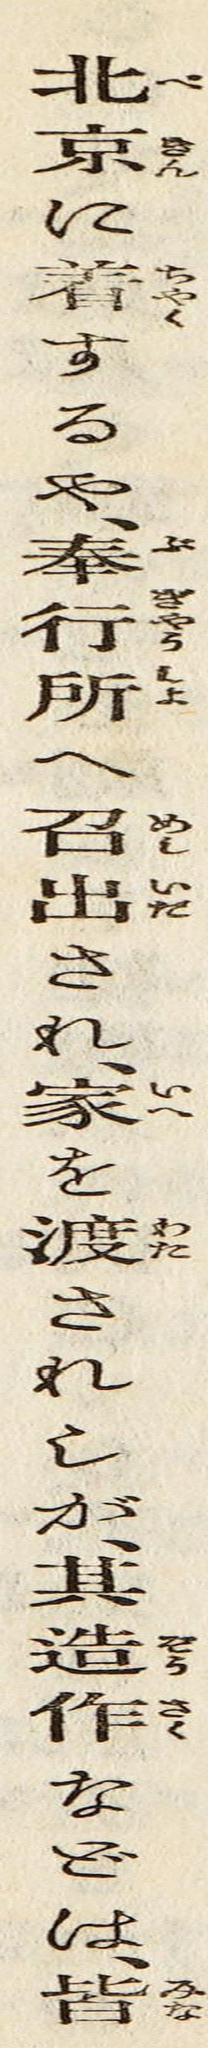北京に着するや、奉行所へ召出され、家を渡されしが、其造作などは、皆
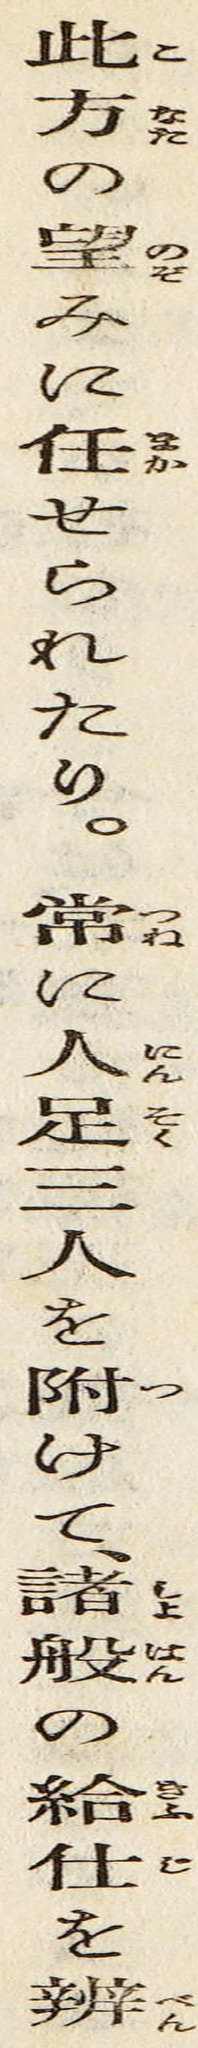此方の望みに任せられたり。常に人足三人を附けて、諸般の給仕を弁
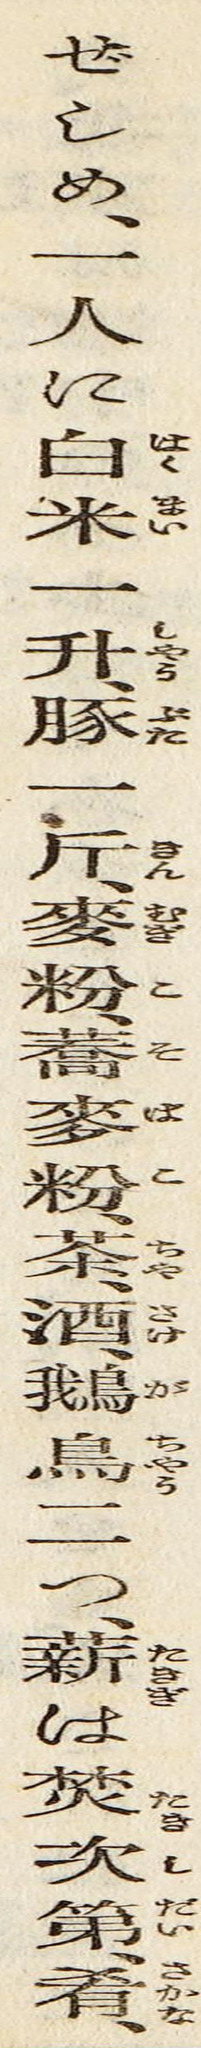ぜしめ、一人に白米一升、豚一斤、麦粉、蕎麦粉、茶、酒、鵞鳥二つ、薪は焚次第、肴、
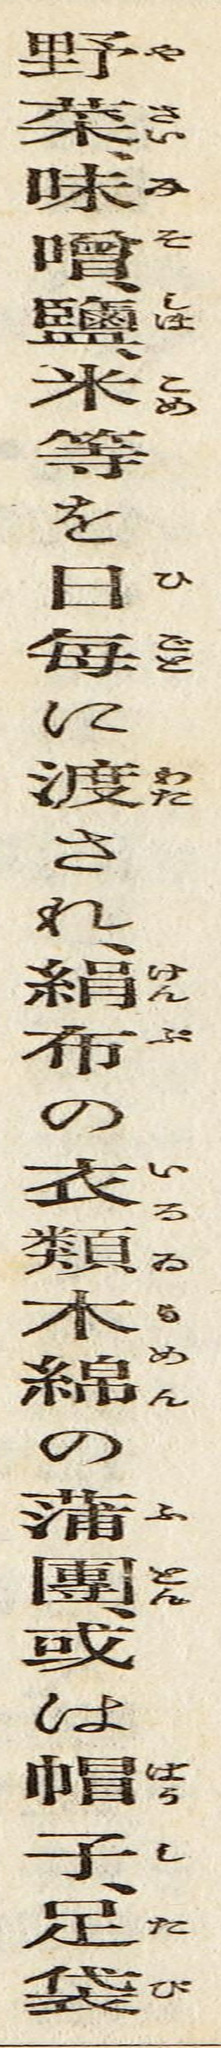野菜、味噌、塩、米等を日毎に渡され、絹布の衣類木綿の蒲団、或は帽子、足袋
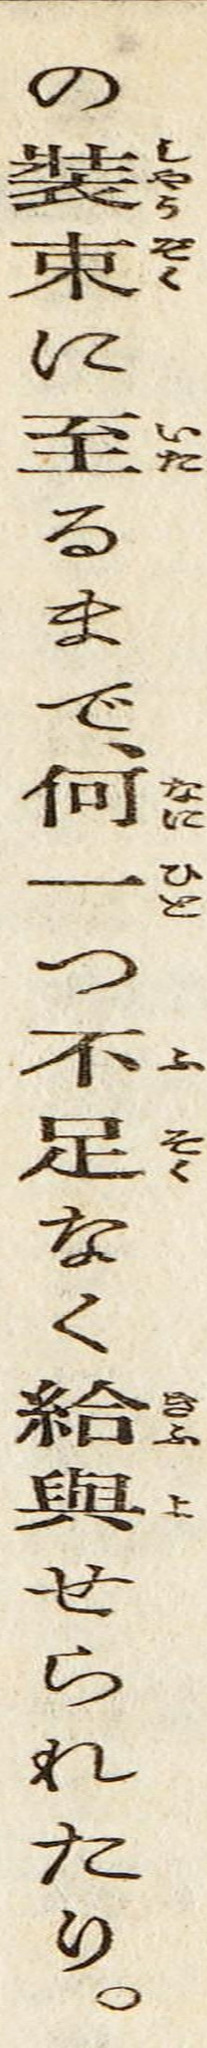の装束に至るまで、何一つ不足なく給与せられたり。
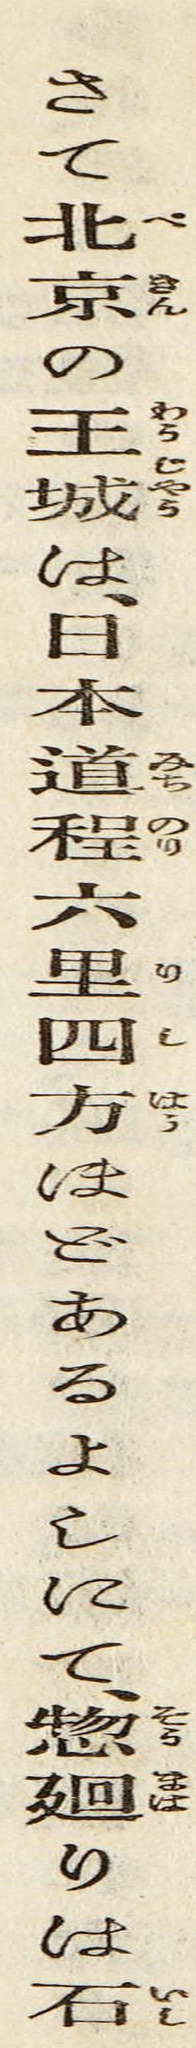さて北京の王城は、日本道程六里四方ほどあるよしにて、総廻りは石
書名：日本漂流譚
